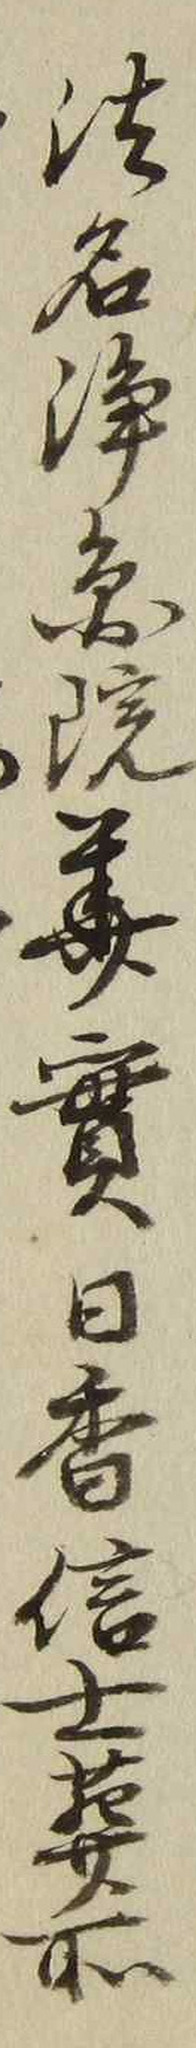法名浄円院華実日香信士葬所
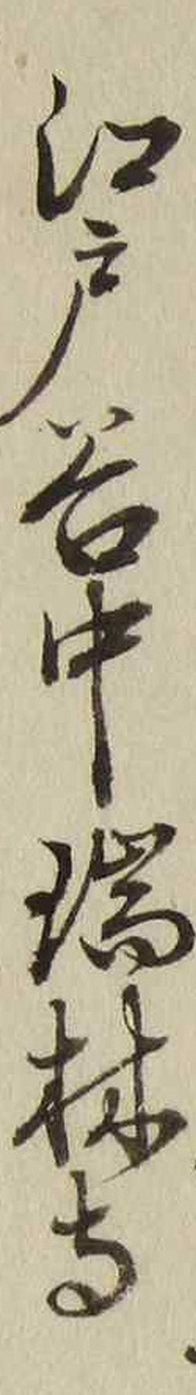江戸谷中瑞林寺

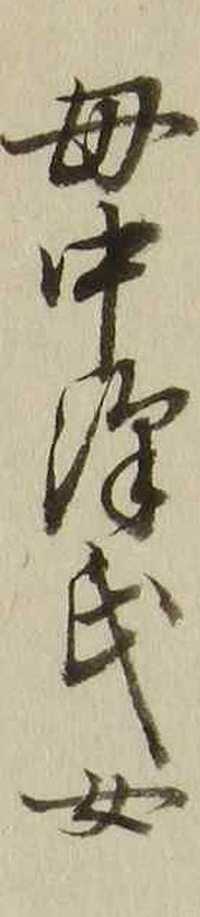母中沢氏女
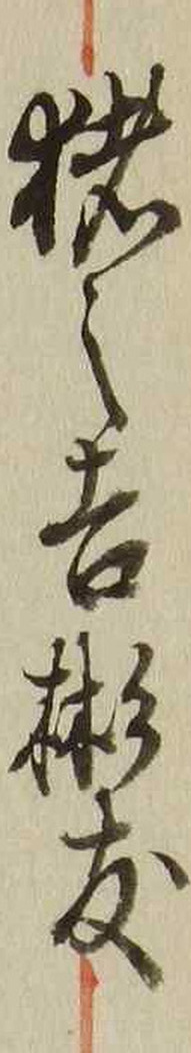猪之吉彬友
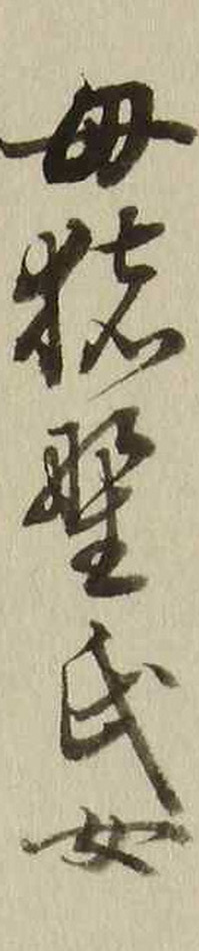母猪野氏女
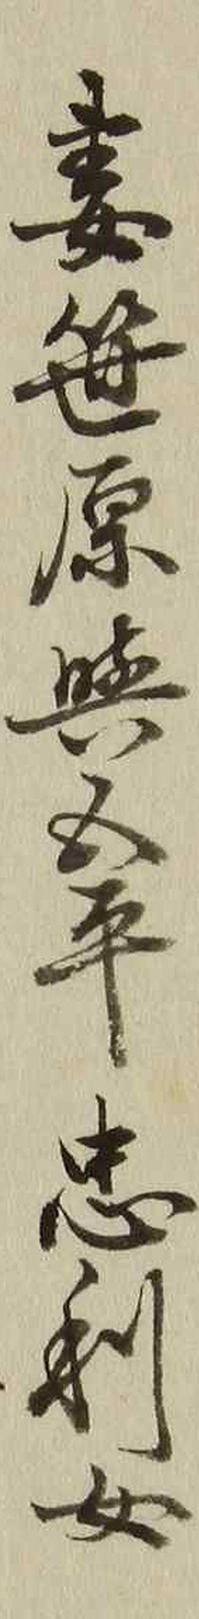妻笹原与五平忠利女
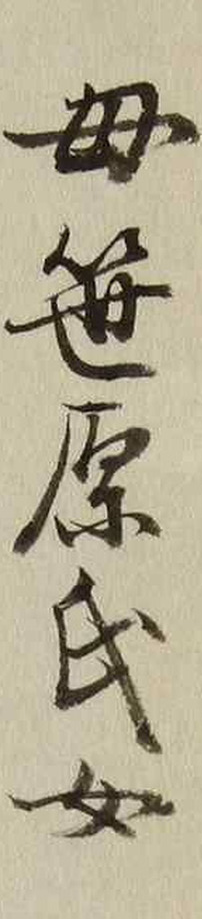母笹原氏女
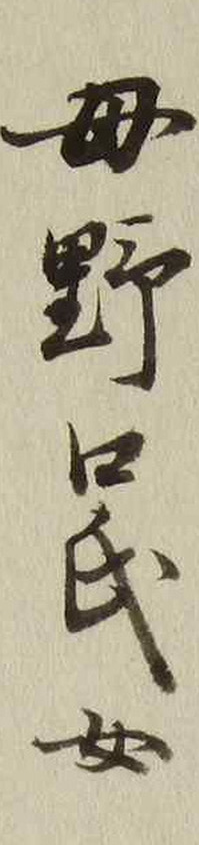母野口氏女
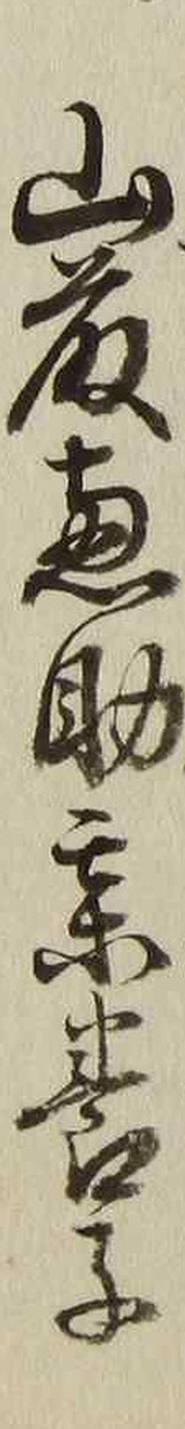山藤恵助某養子
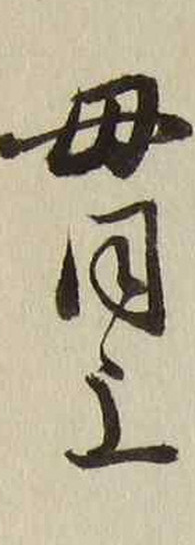母同上

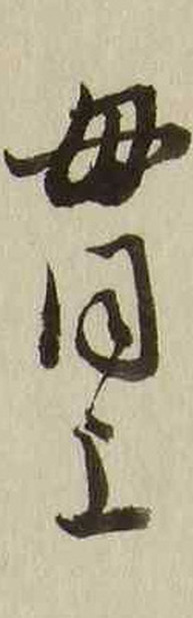母同上
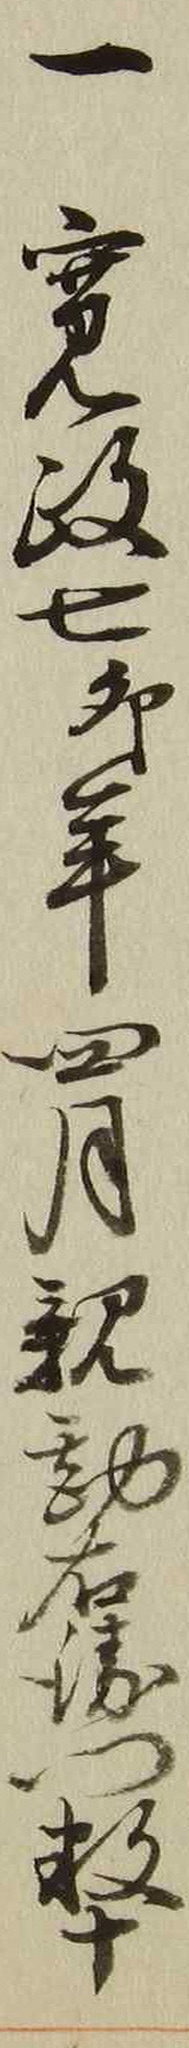一寛政七卯年四月親勘右衛門数十
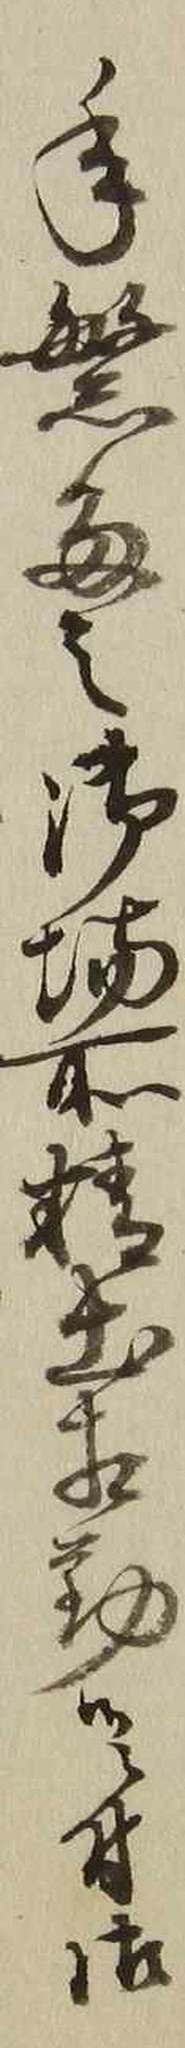年繫多之御場所精出相勤候ニ付御
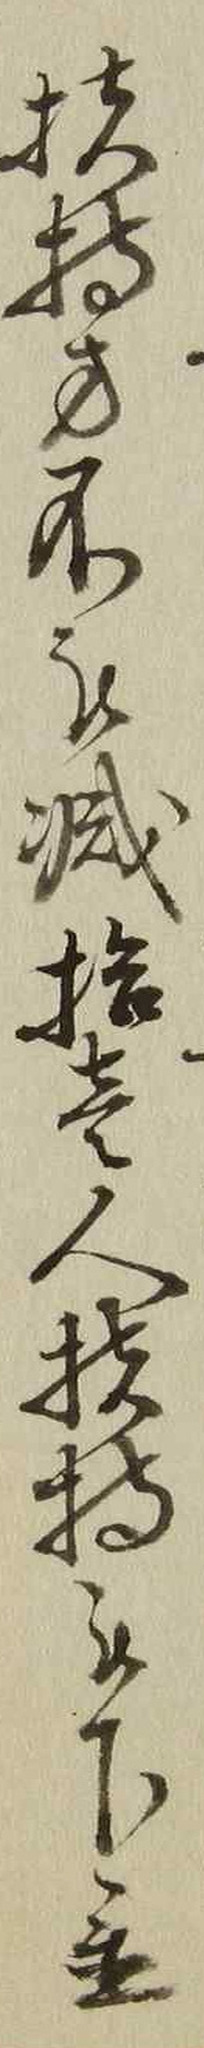扶持方不被減拾壱人扶持被下置
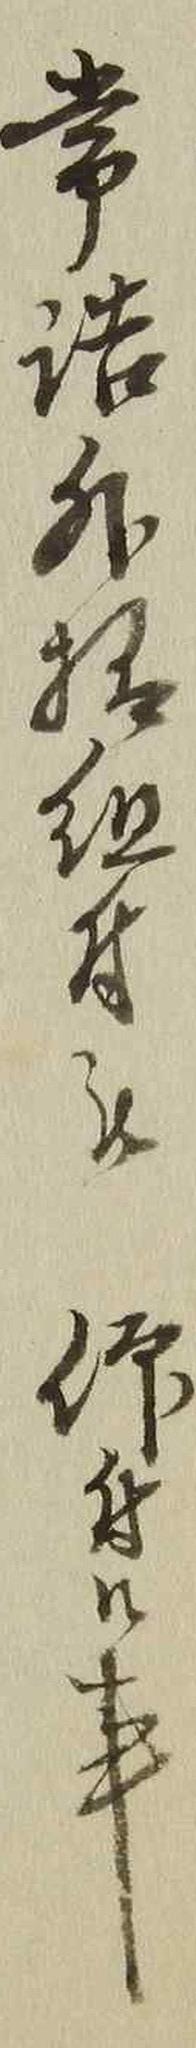常詰外様組付被仰付候事
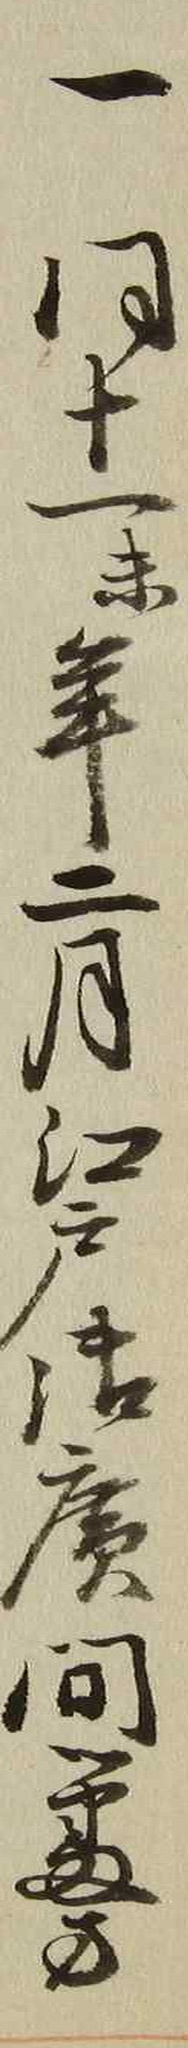一同十一未年二月江戸御広間番方
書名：諸士系譜　巻之31　い之部31
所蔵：会津若松市立会津図書館
